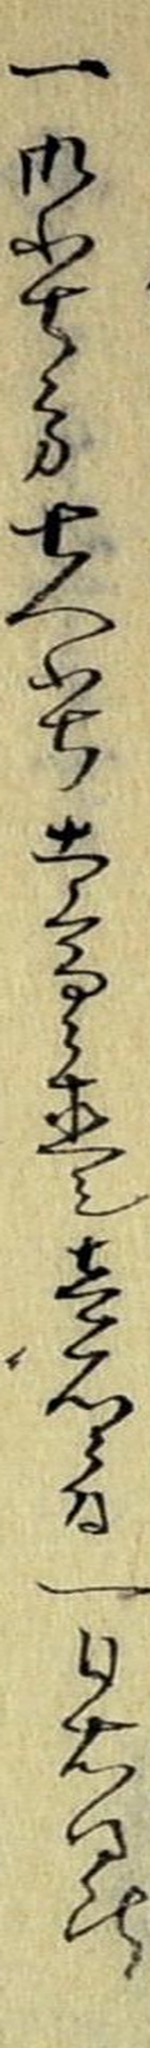一御扶持方七人ふち出高に直し壱石に付一日右同断
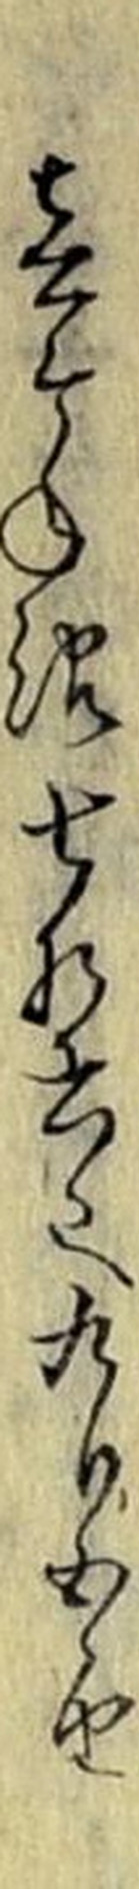壱ヶ年銀七拾六匁九分五厘
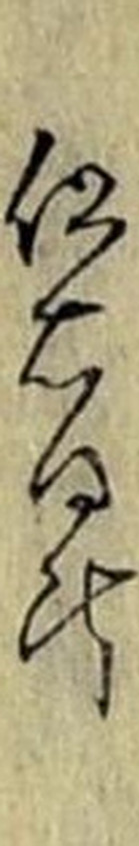但右同断
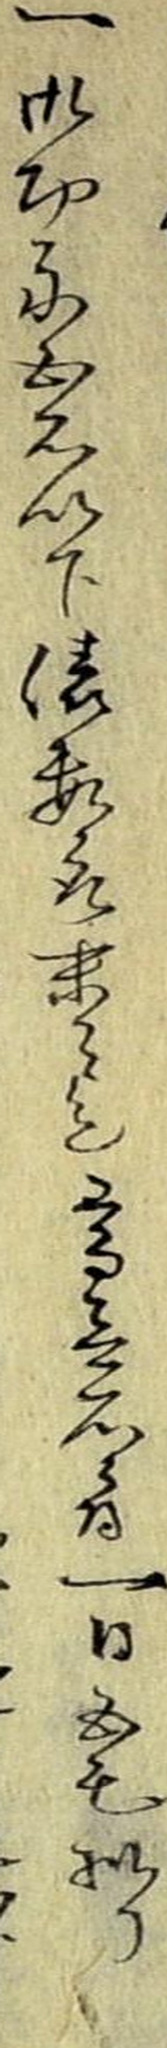一御切米五石以下俵数取末々迄高壱石に付一日五毛掛り
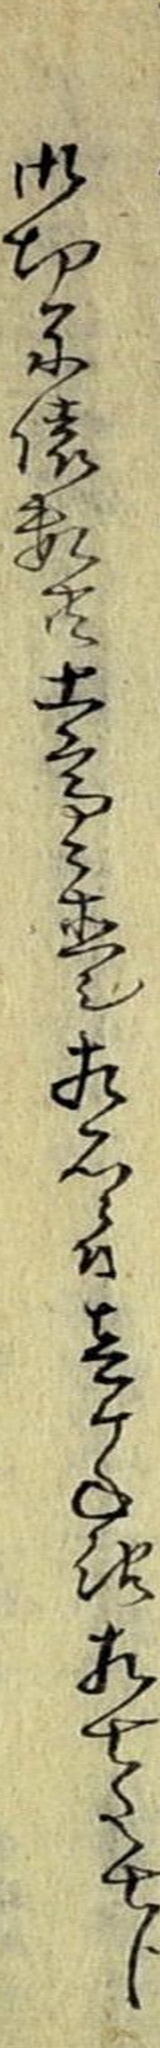御切米俵数共出高に直し拾石に付壱ヶ年銀拾七匁七分
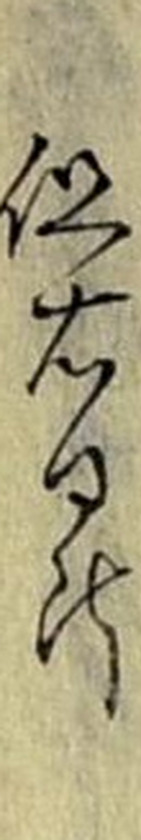但右同断
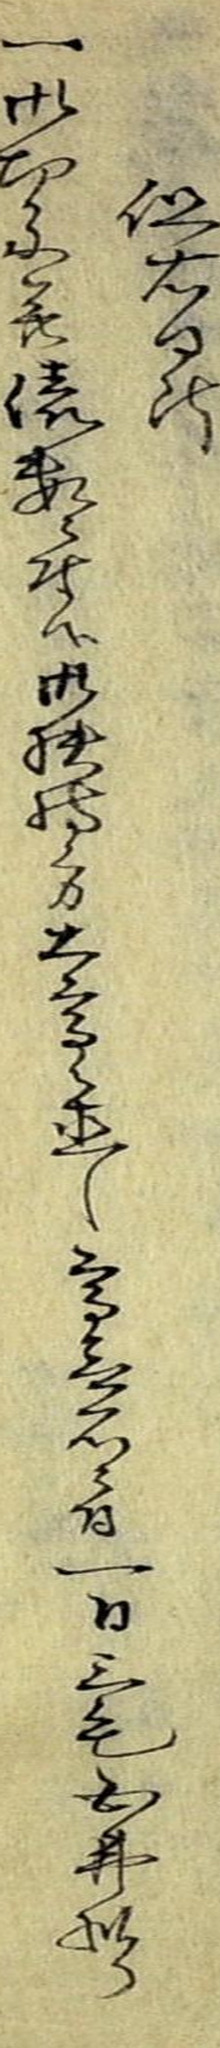一御切米并俵数に付候御扶持方出高に直し高壱石に付一日三毛五弗掛り
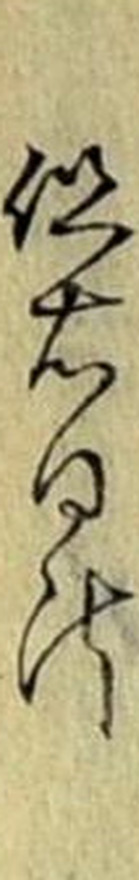但右同断
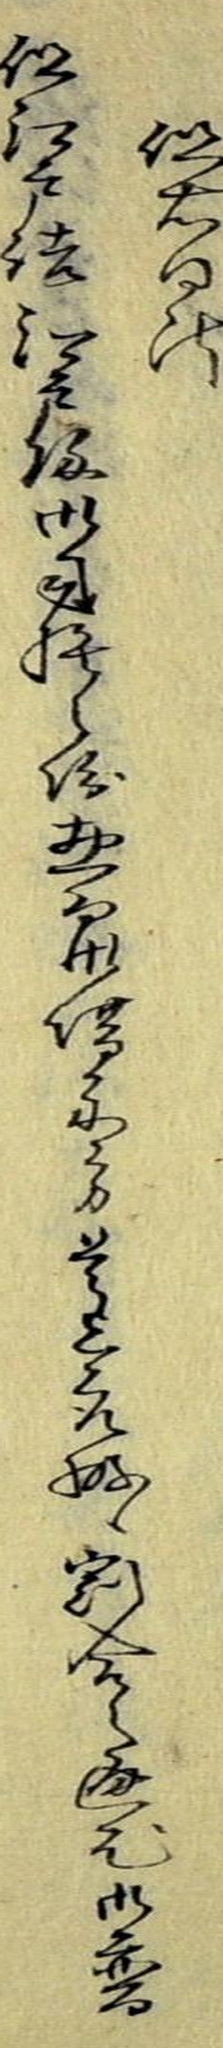但江戸詰江戸帰御用捨之儀惣而御借米方是迄取扱候割合之通尤御普

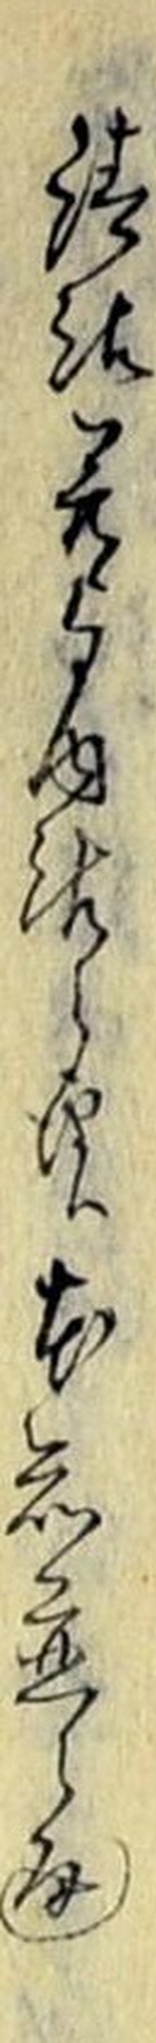請銀并与内銀之儀は本知並之通
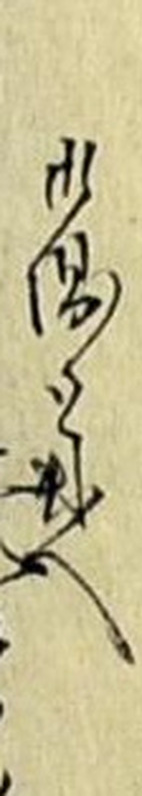御側御用人
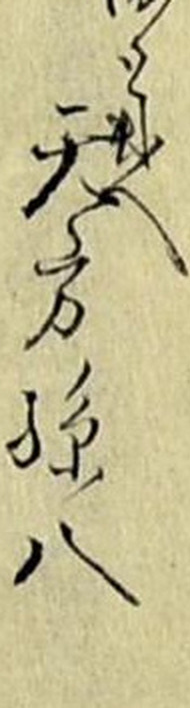天方孫八
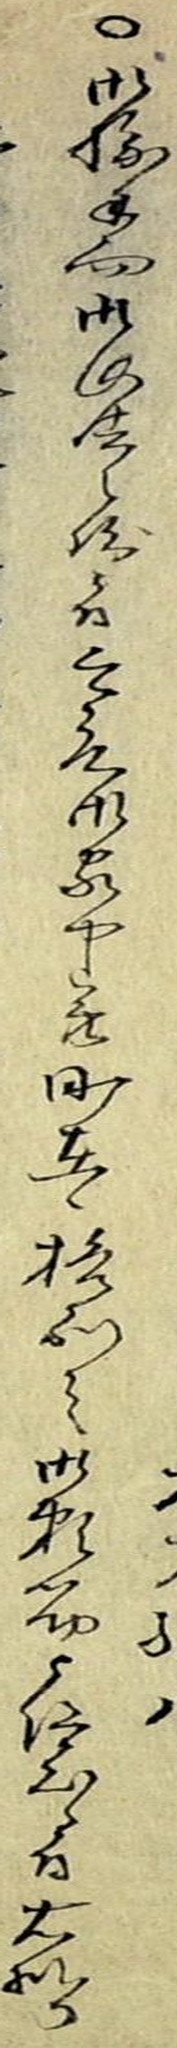○御勝手向御趣法之儀に付今度御家中并町在へ各別之御頼筋被仰出候に付右掛り
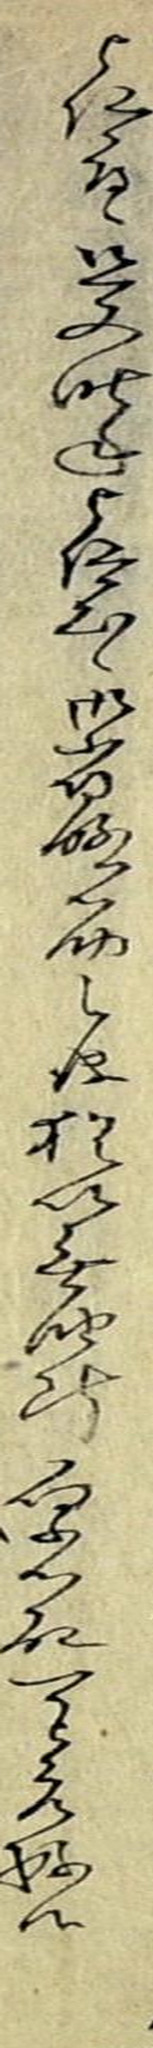被仰付候且又昨年被仰出候御省略筋之儀猶以無由断厚心配可被取扱候
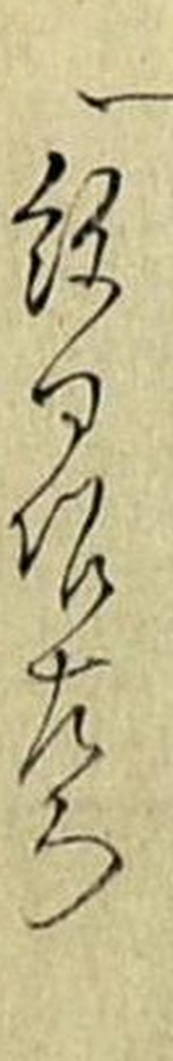飯田作左衛門
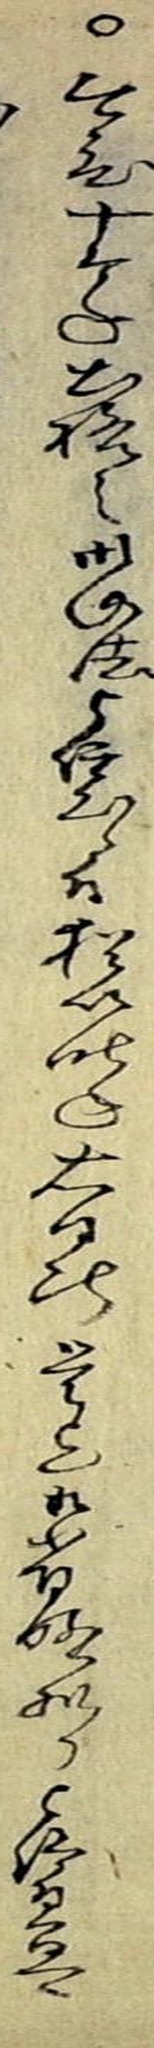○今度十ヶ年出格之御趣法被仰出候に付猶以昨年右同断是迄御省略掛り被仰付置候
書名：命令之部 六
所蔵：福井県文書館 Fukui Prefectural Archives
